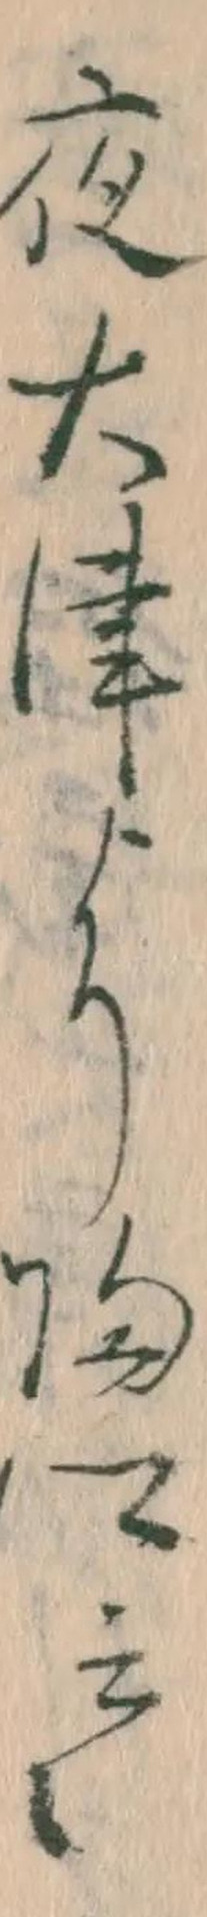夜大津より帰郷云々
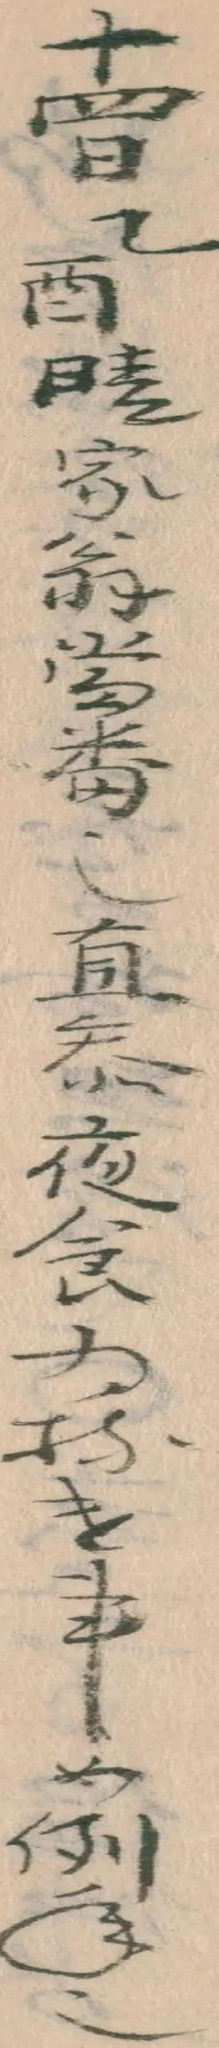十四日乙酉晴家翁當番也直参夜食為持遣事如例年也
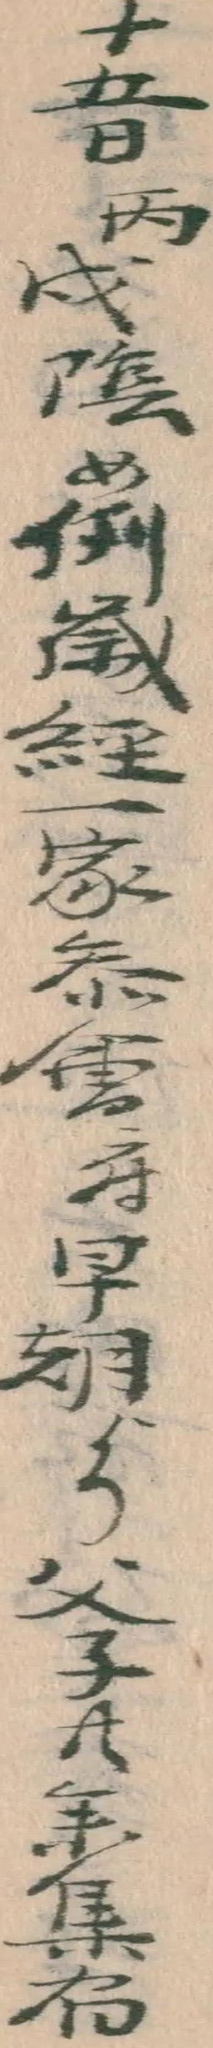十五日丙戌陰如例歳経一家参會ニ付早朝より父子共参集有
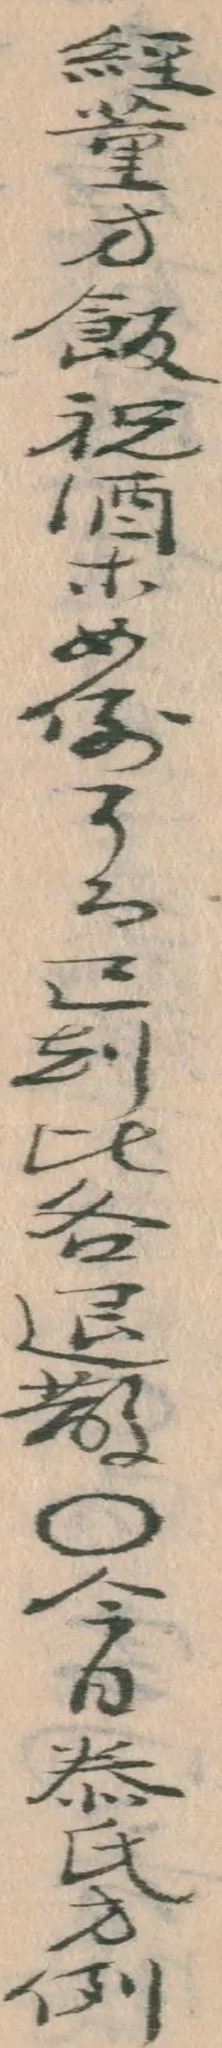経董方飯祝酒等如例了而巳刻比各退散○今日泰氏方例
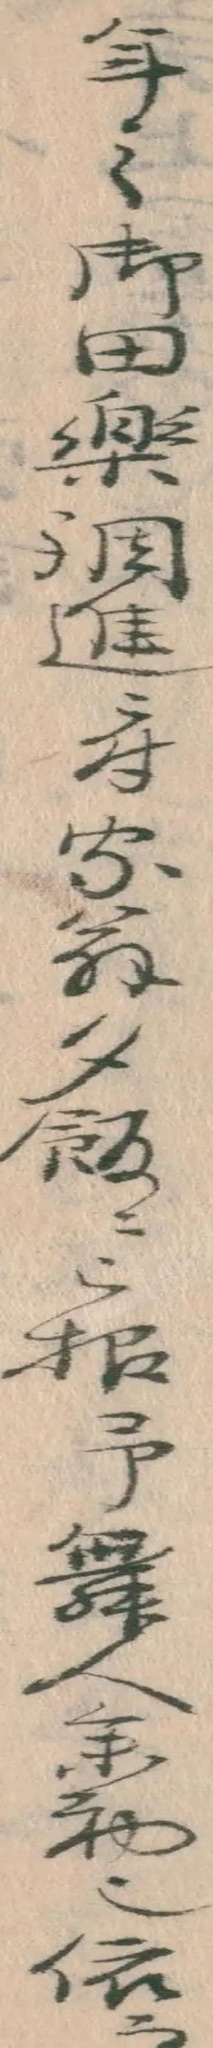年之御田楽調進ニ付家翁夕飯ニ被招予舞人参勤也依而
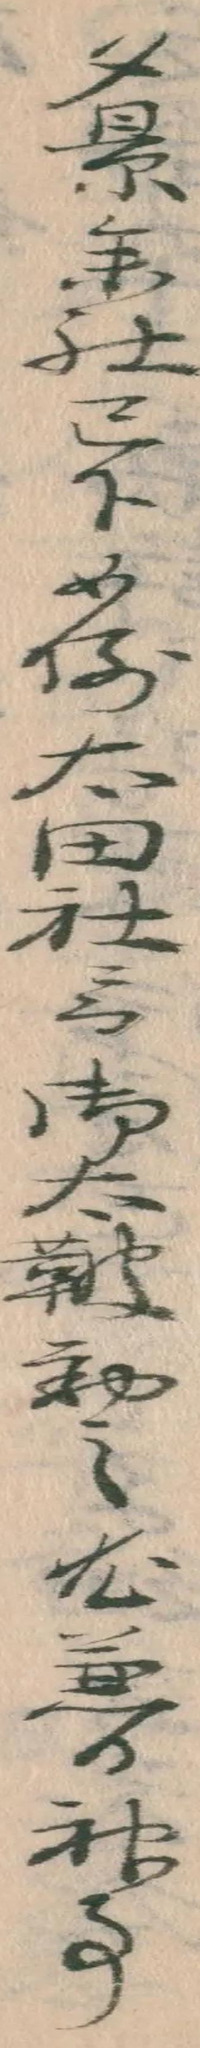夕景参社已下如例太田社ニ而御太鼓勤之尤兼日神事
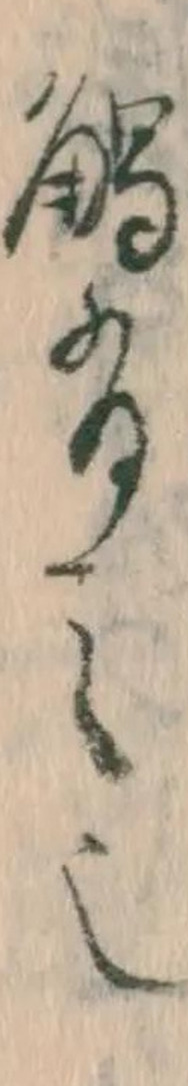觸有之也
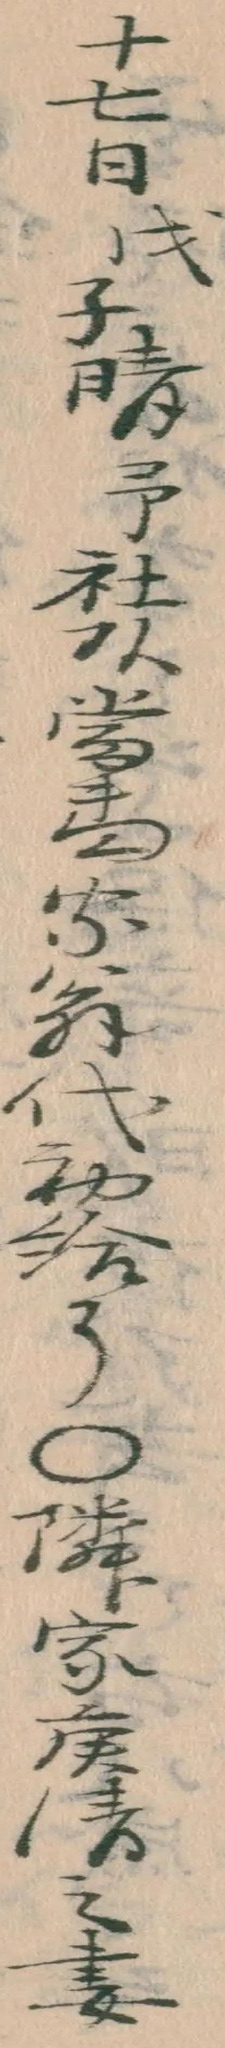十七日戊子晴予社頭當番家翁代勤給了○隣家庚清之妻
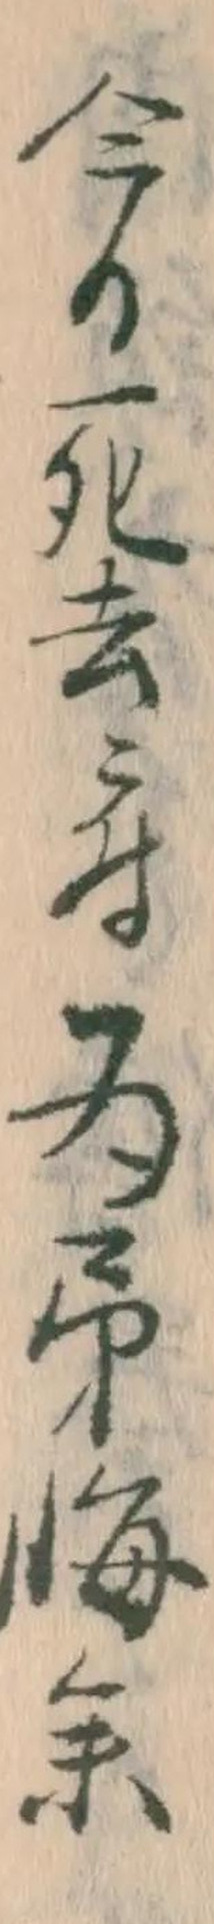今日死去ニ付為予悔参
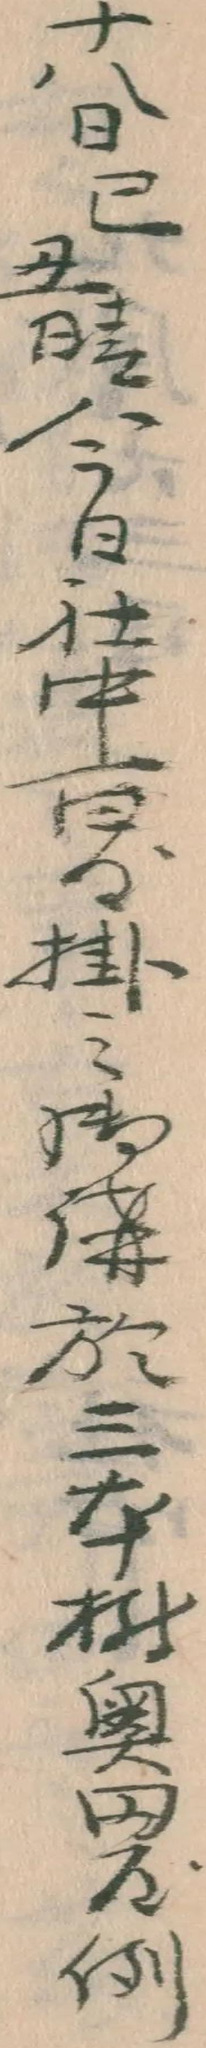十八日己丑晴今日社中百姓掛之御講於三本樹奥田屋例
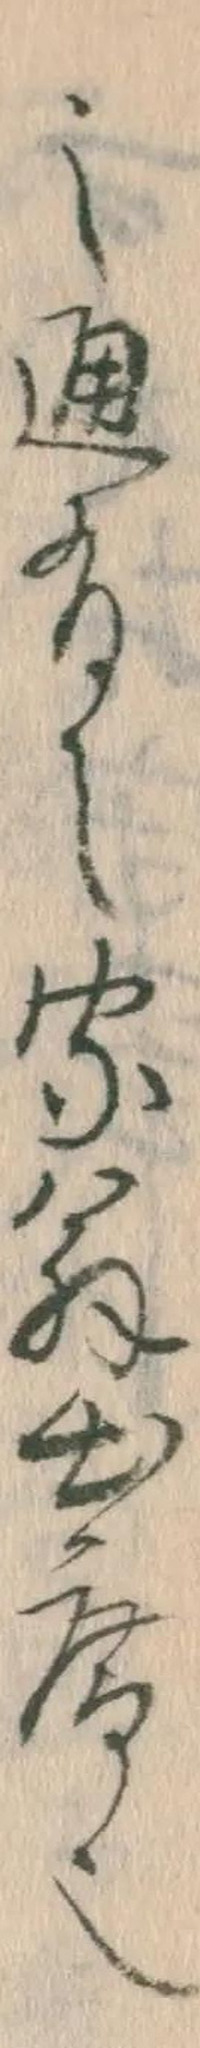之通有之家翁出席也
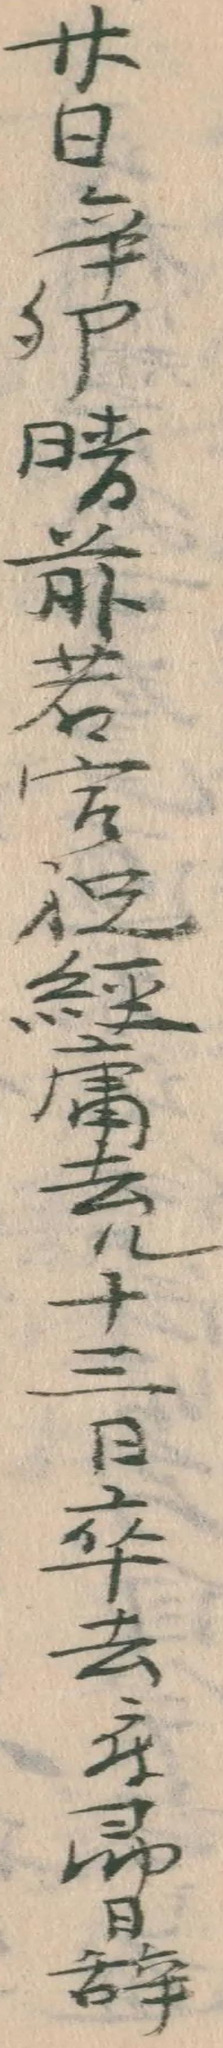廿日辛卯晴前若宮祝経庸去ル十三日卒去ニ付即日辞
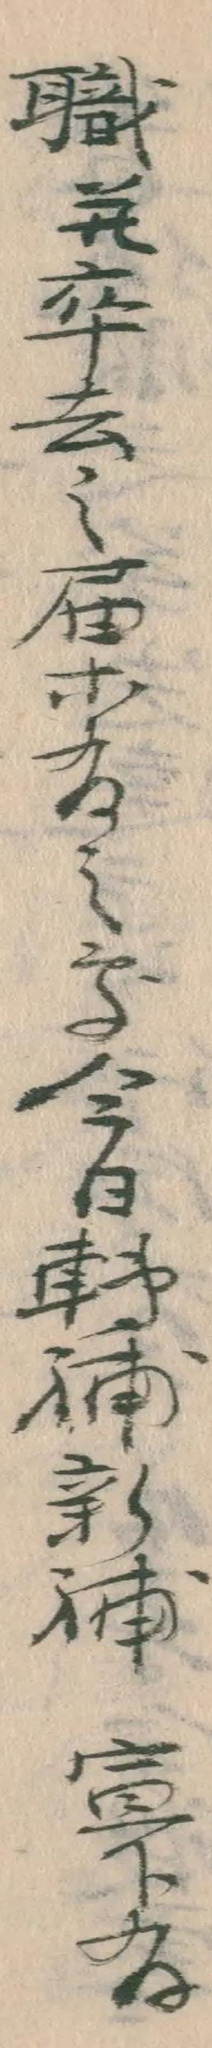職并卒去之届等有之處今日轉補新補宣下有
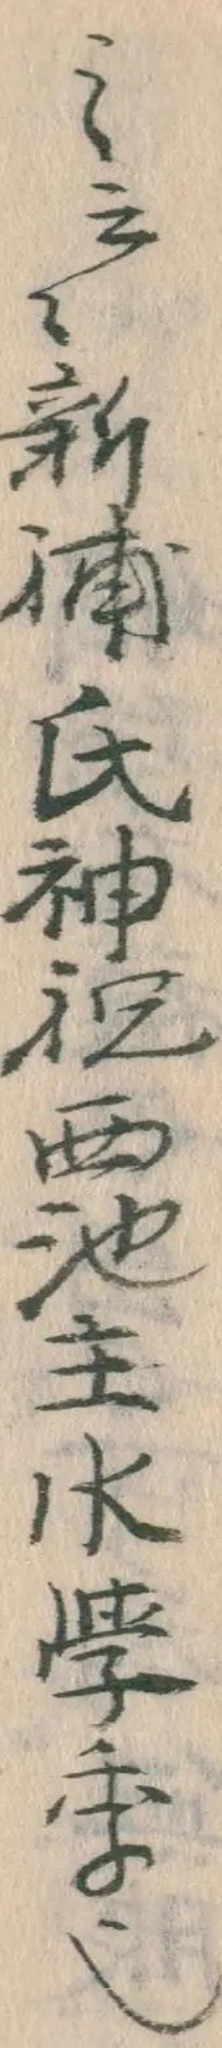之云〻新補氏神祝西池主水學季也
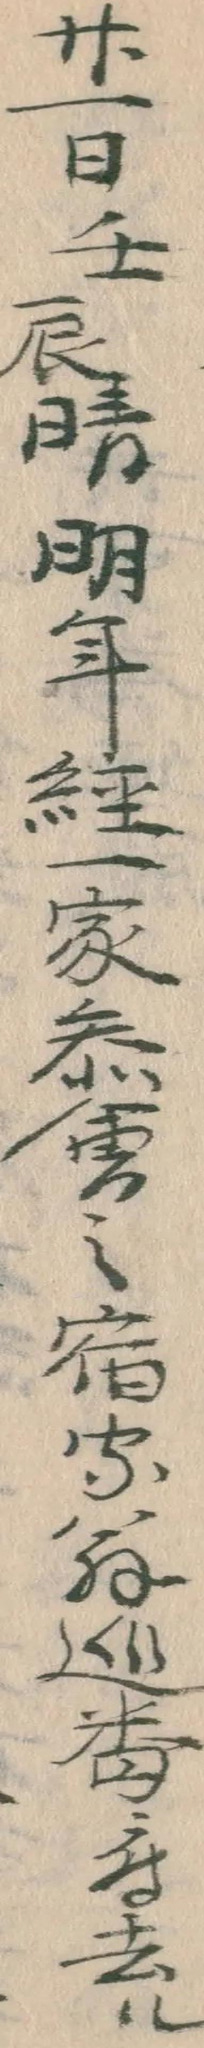廿一日壬辰晴明年経一家参會之宿家翁巡番ニ付去ル
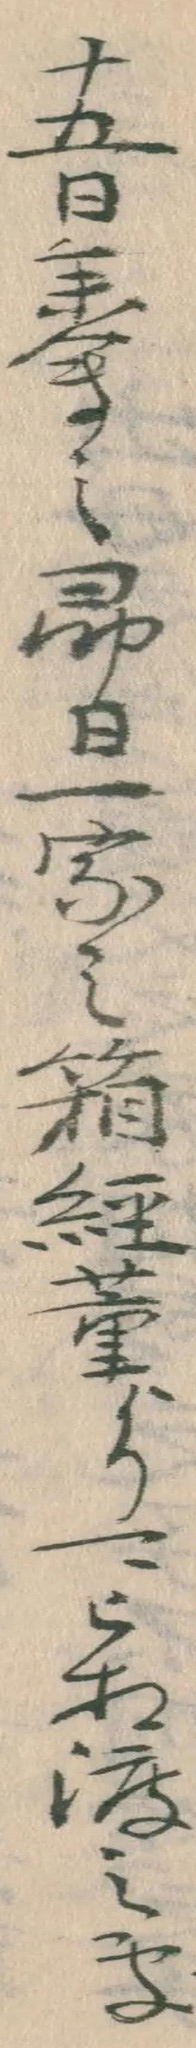十五日参會之即日一家之箱経董より可被相渡之處
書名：賀茂社記録. 第63冊
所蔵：国立国会図書館 National Diet Library, JAPAN
